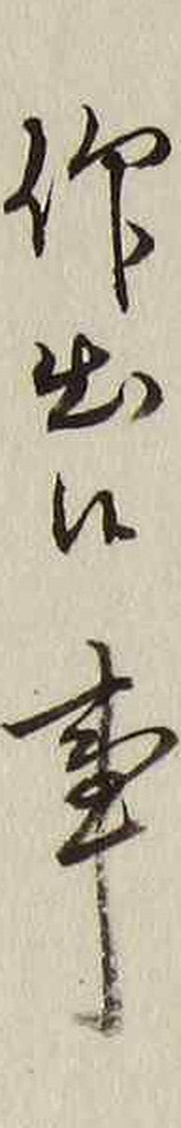仰出候事
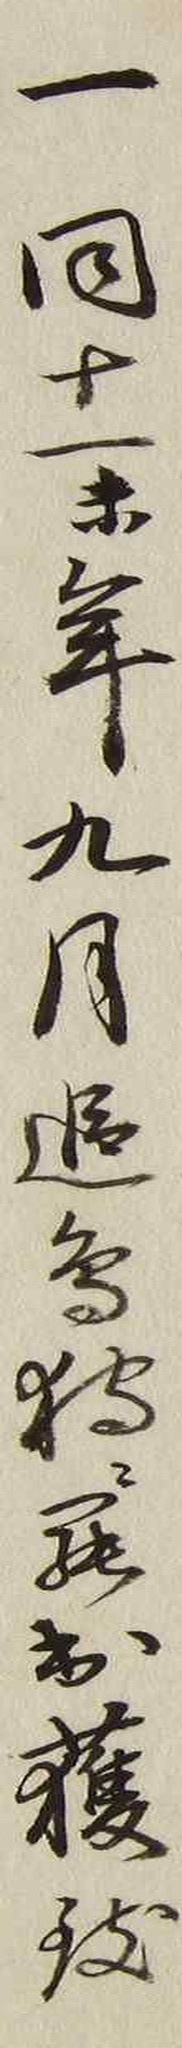一同十一未年九月追鳥狩ニ罷出獲致
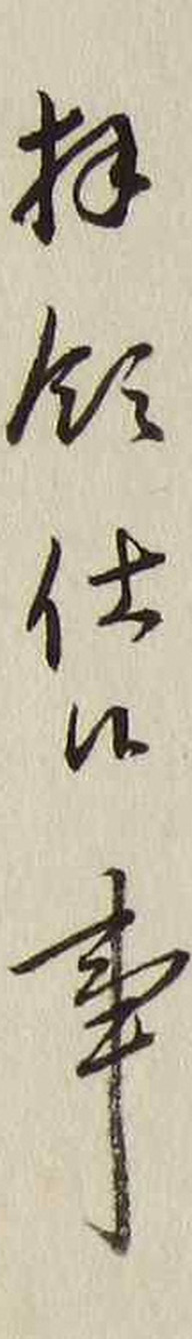拝領仕候事

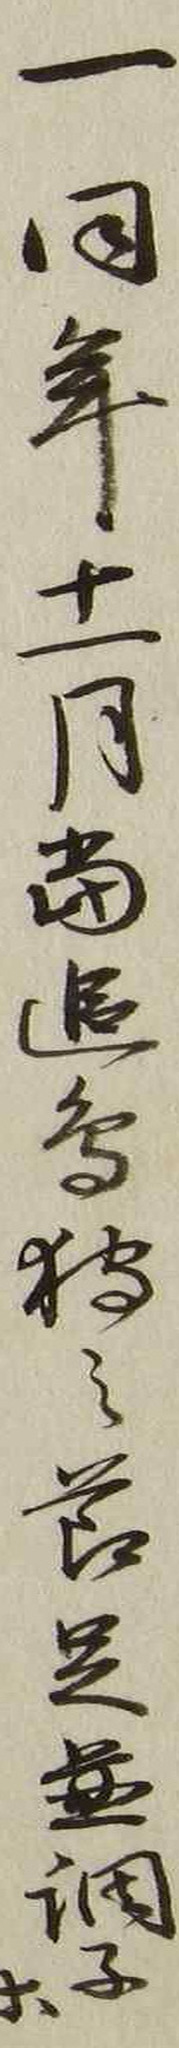一同年十一月当追鳥狩之節足並調子等
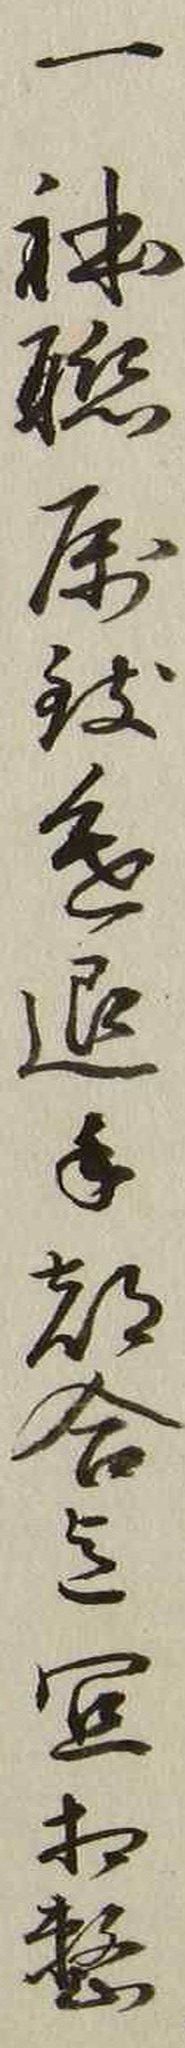一体聯属致進退手都合迄宜相整
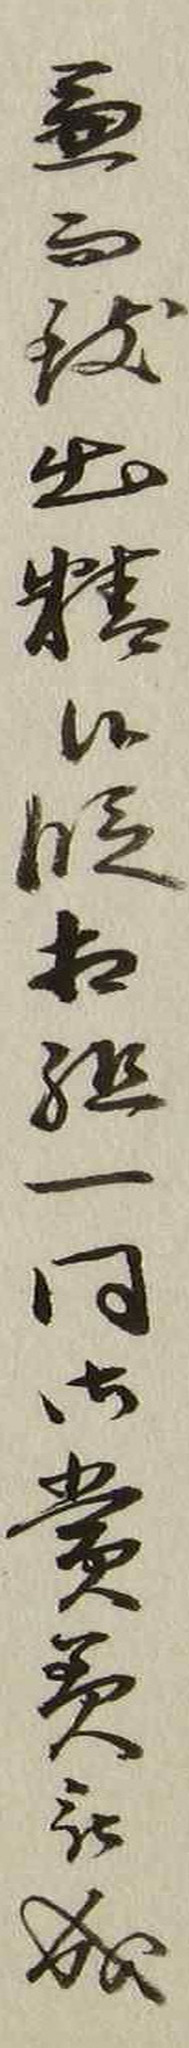兼而致出精候段相組一同御賞美被成
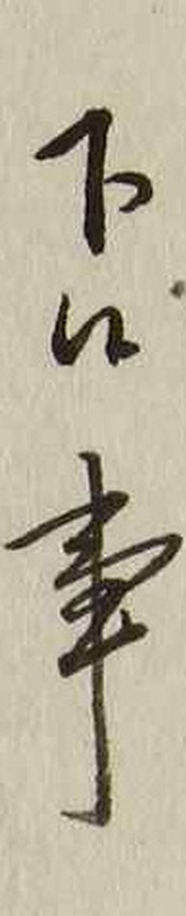下候事
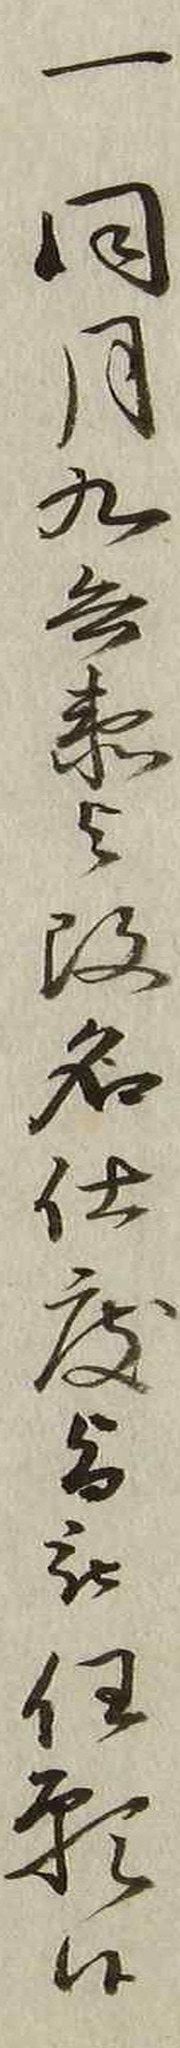一同月九兵衛と改名仕度旨被任願候
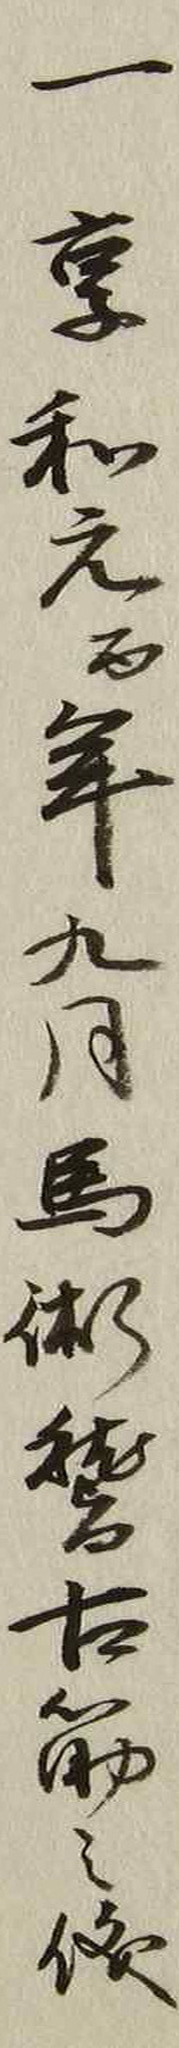一享和元酉年九月馬術稽古筋之儀
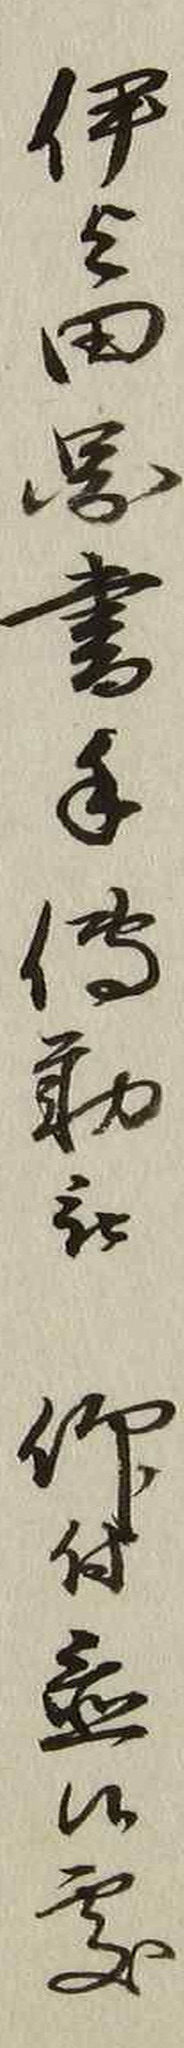伊与田図書手伝勤被仰付置候処
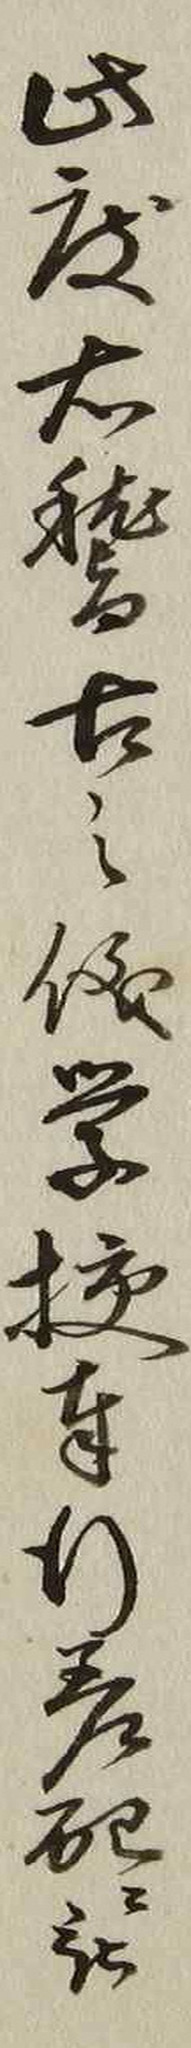此度右稽古之儀学校奉行差配ニ被
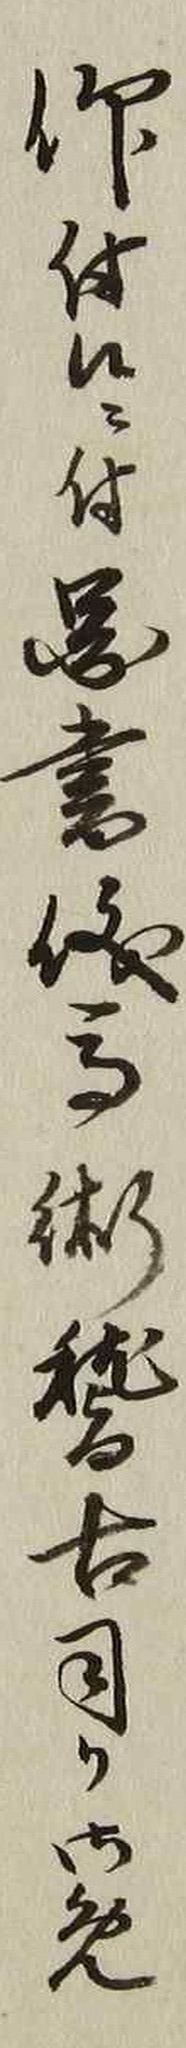仰付候ニ付図書儀馬術稽古司り御免
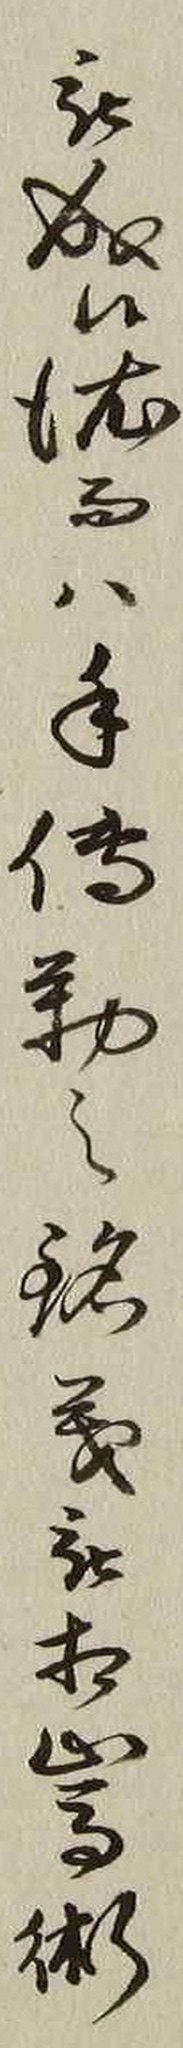被成候依而ハ手伝勤之銘義被相止馬術
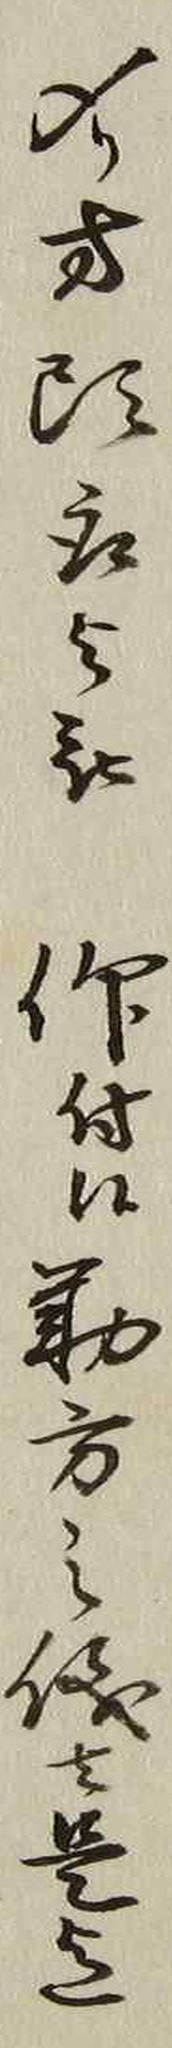〆り方頭取と被仰付候勤方之儀は是迄
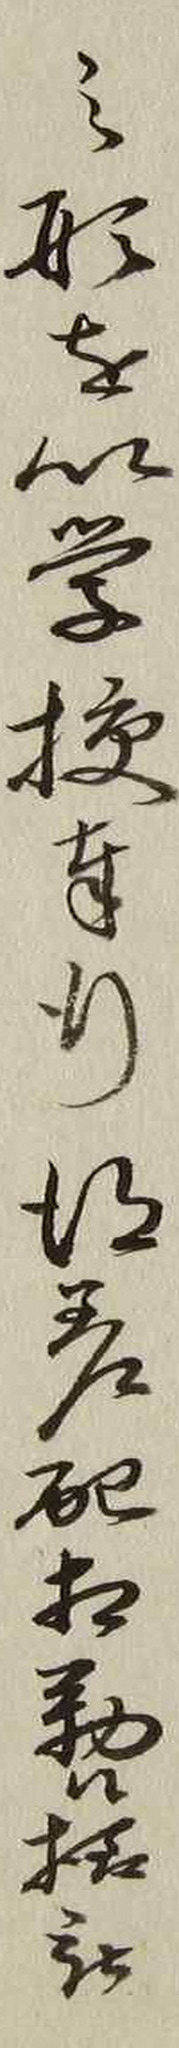之形を以学校奉行得差配相勤候様被
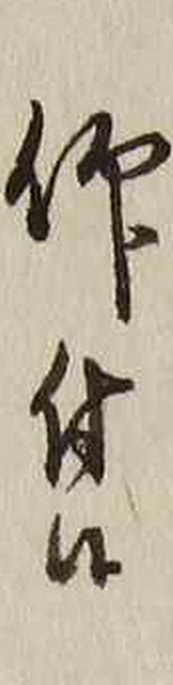仰付候
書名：諸士系譜　巻之160　な之部2
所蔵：会津若松市立会津図書館
